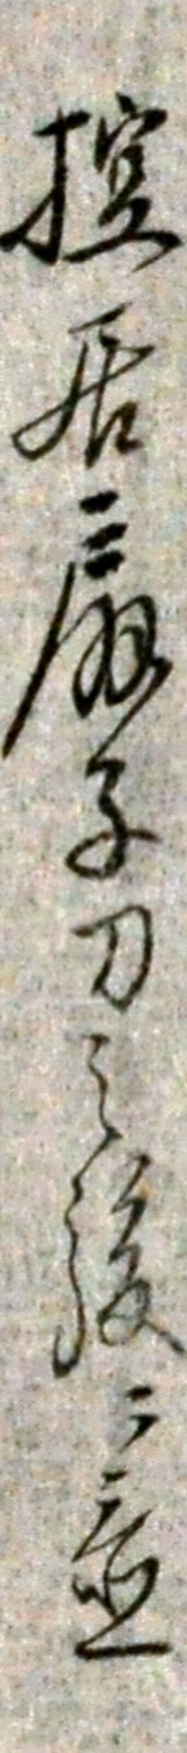控居扇子刀之後ニ置
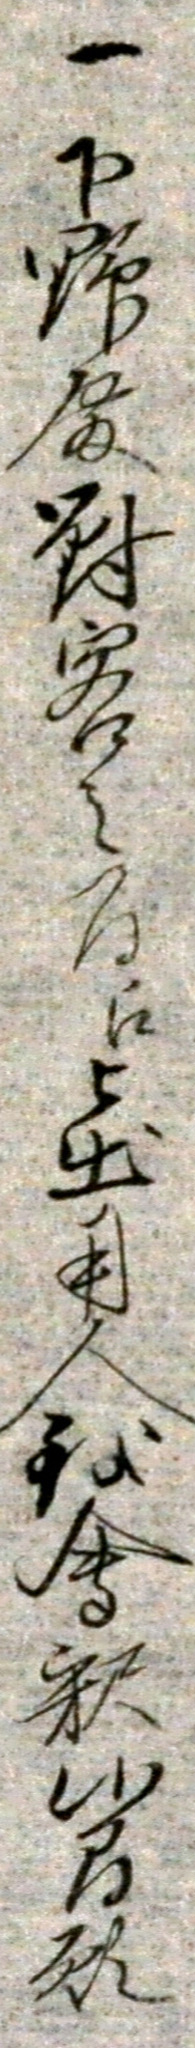一下野殿対客之間え被出用人致会釈候間願
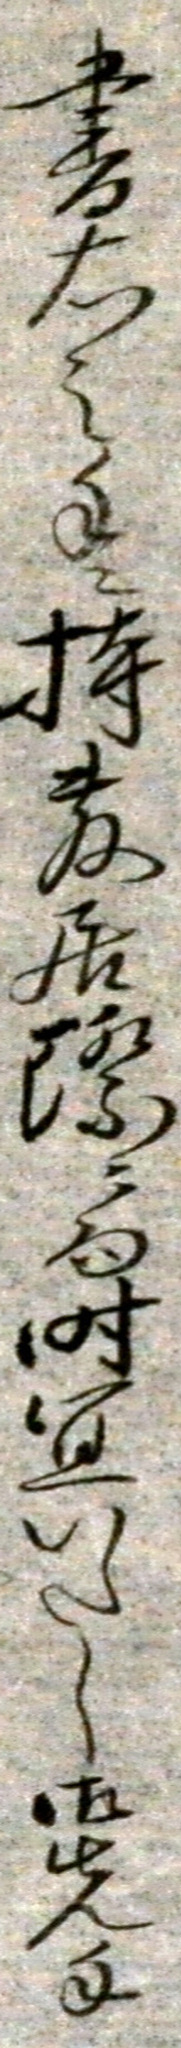書右之手ニ持敷居際ニ而時宜いたし御先手
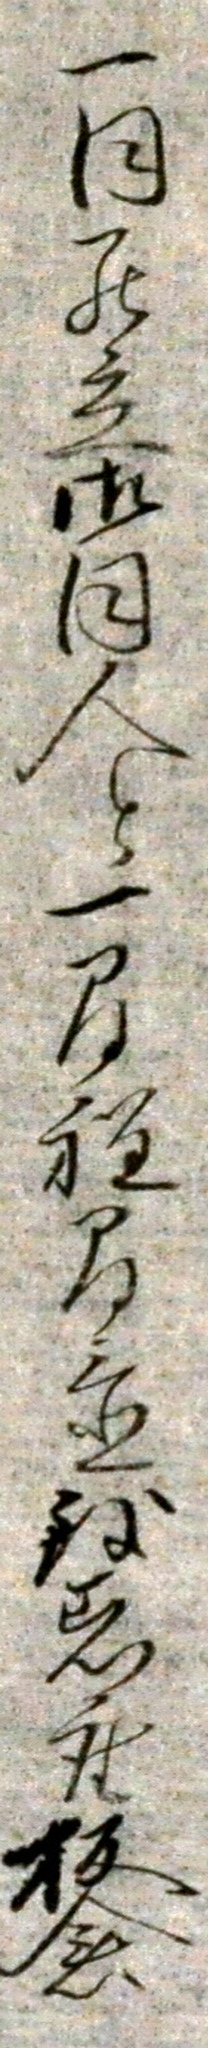一同罷立御同人と一間程間置致着座板倉
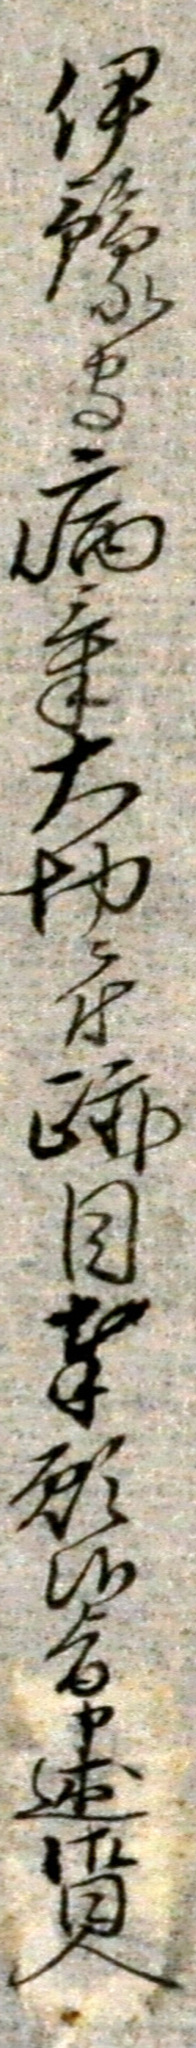伊豫守病気大切ニ付跡目奉願候旨申述御同人
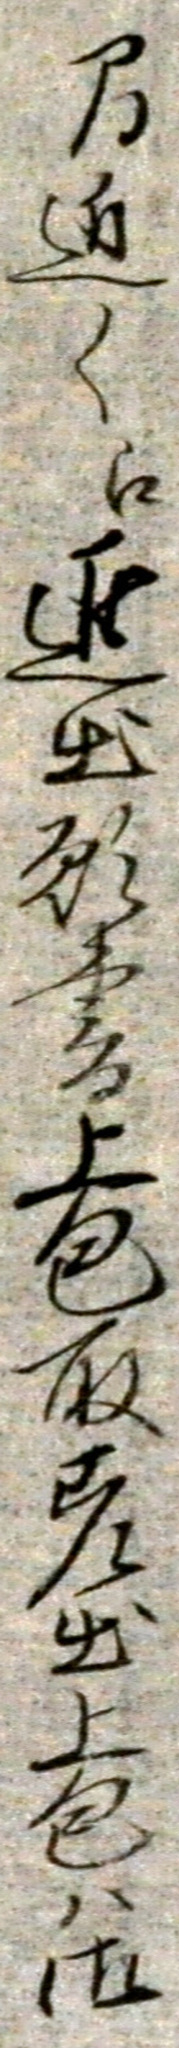間近〳〵え進出願書上包取差出上包ハ御
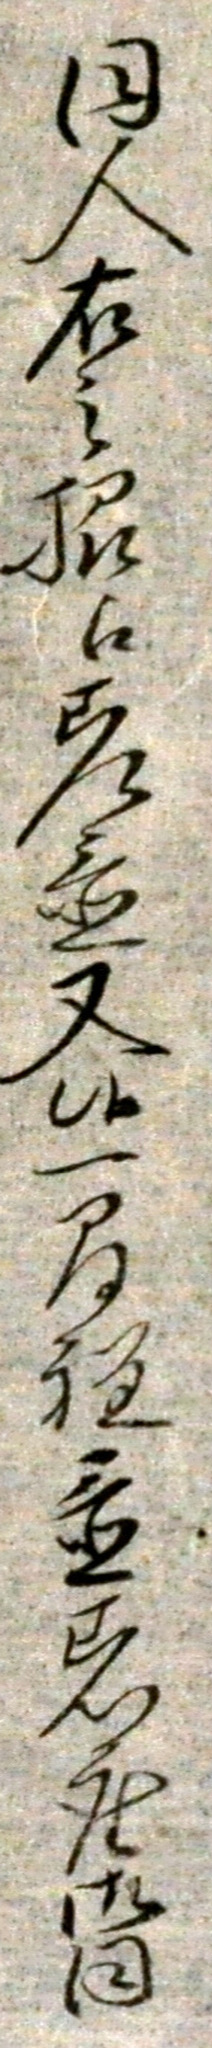同人右之脇え差置又候一間程置着座御同
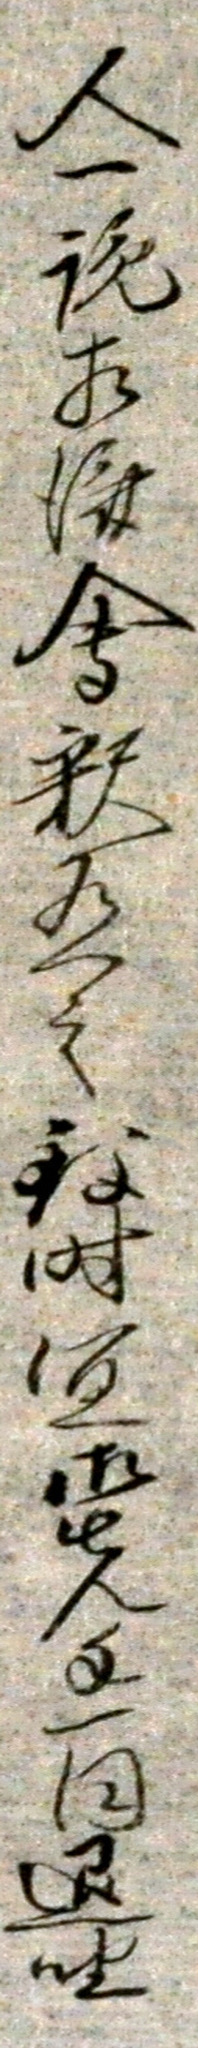人一覧相済会釈有之致時宜御先手一同退坐
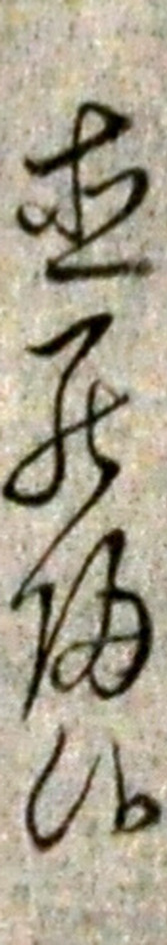直罷帰候
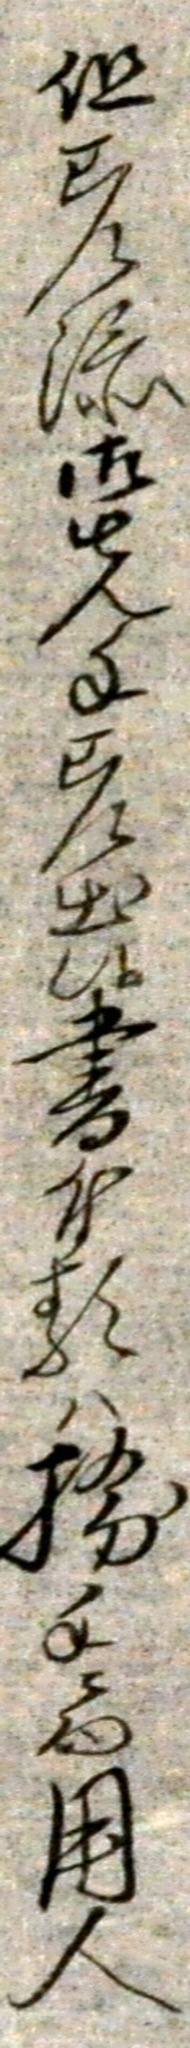但差添御先手差出候書付類ハ勝手ニ而用人
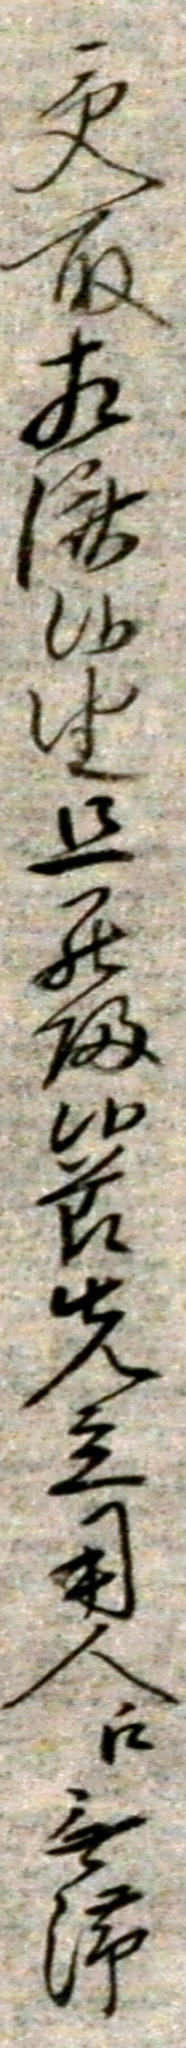受取相済候由且罷帰候節先立用人え無滞
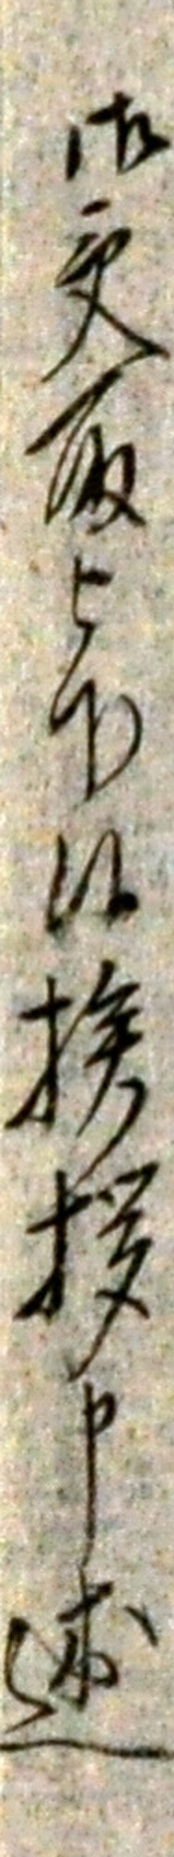御受取被下候挨拶申述
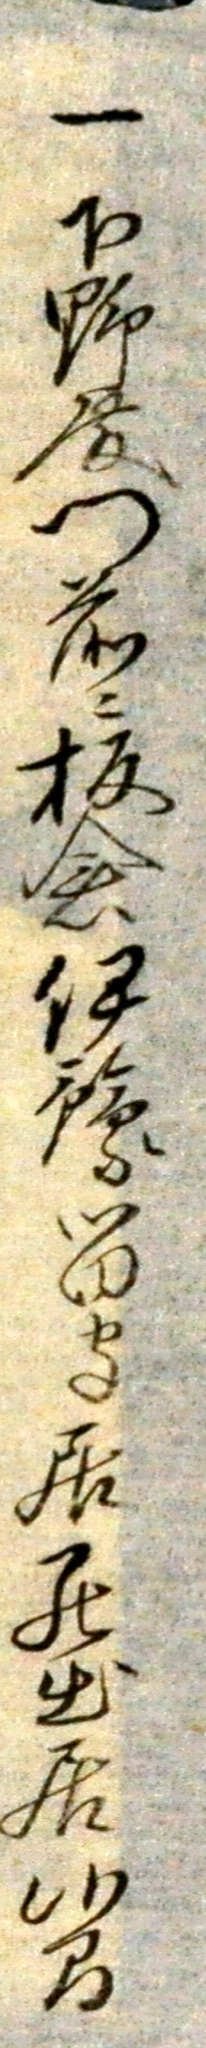一下野殿門前ニ板倉伊豫留守居罷出居候間
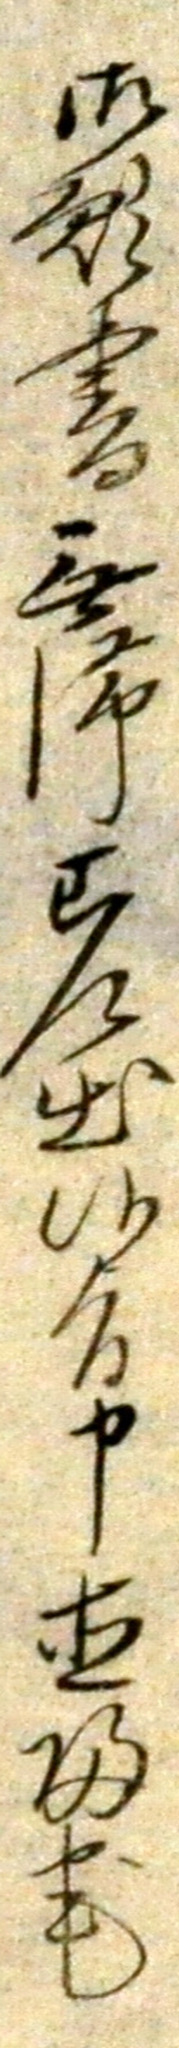御願書無滞差出候旨申直帰宅

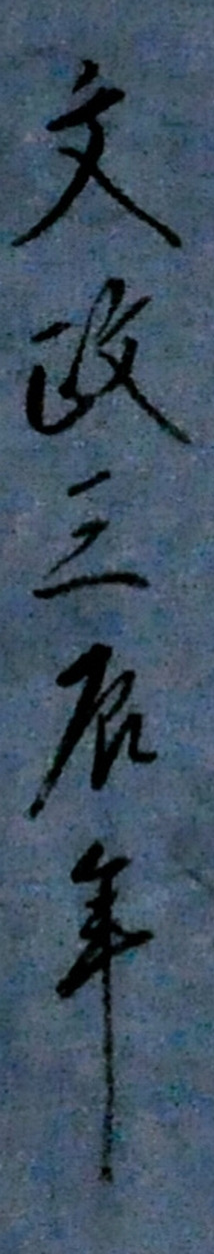文政三辰年
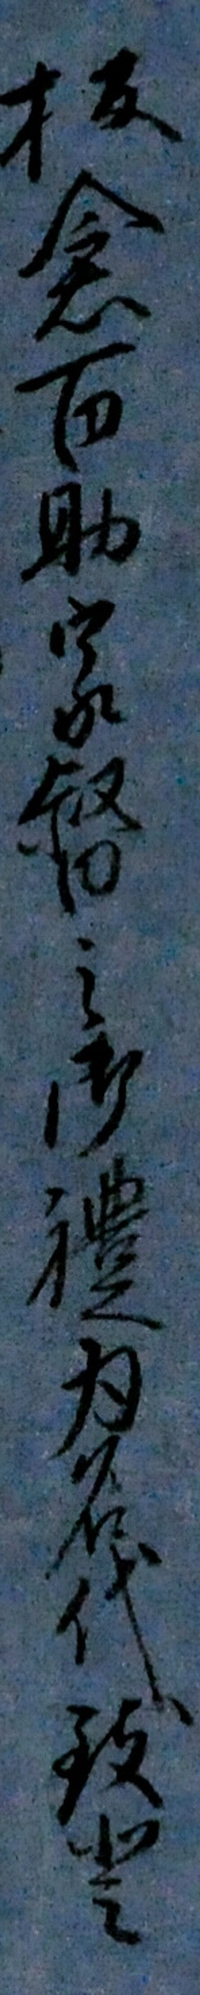板倉百助家督之御礼為名代致登
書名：諸名代相勤候節ノ留書外
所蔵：伊那市立高遠町図書館・合同会社AMANE
